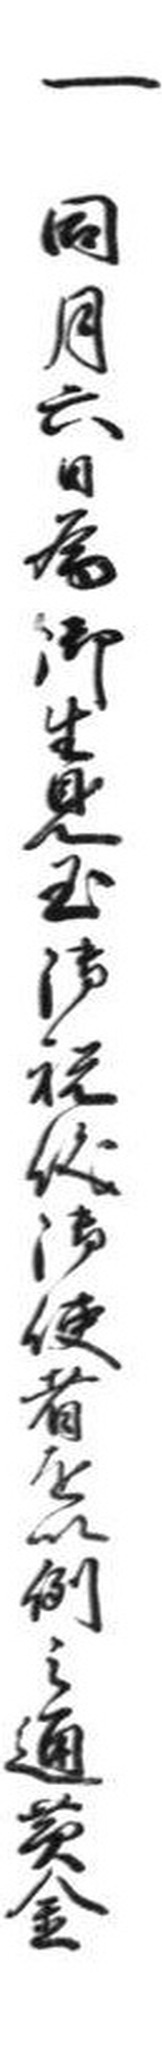一同月六日為御生見玉御祝儀御使者を以例之通黄金
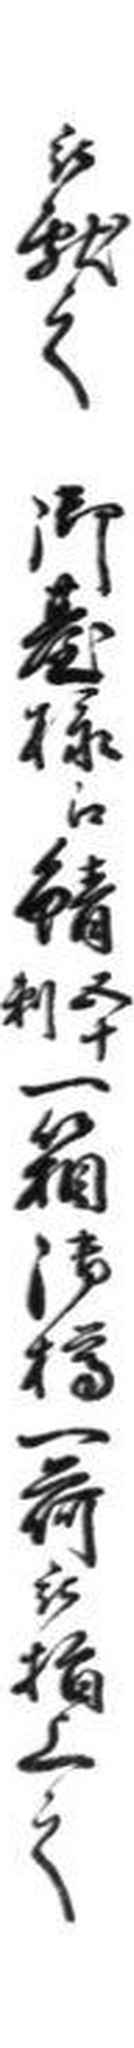被献之御台様江鯖五十刺一箱御樽一荷被指上之
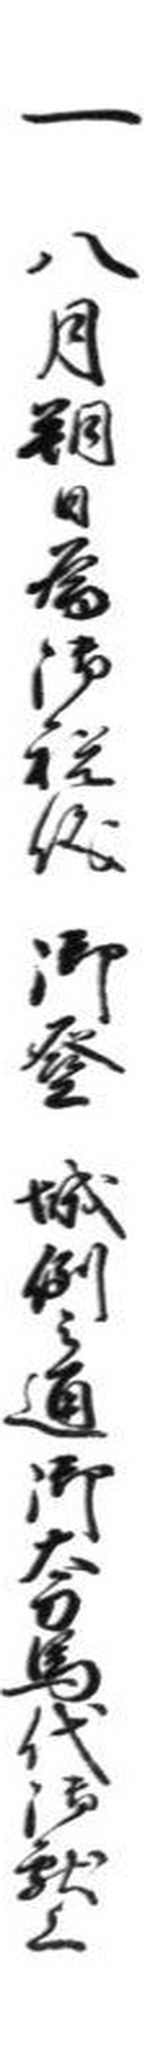一八月朔日為御祝儀御登城例之通御太刀馬代御献上
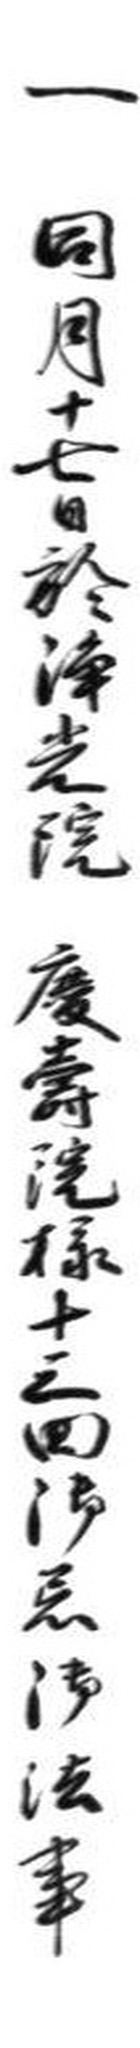一同月十七日於浄光院慶寿院様十三回御忌御法事
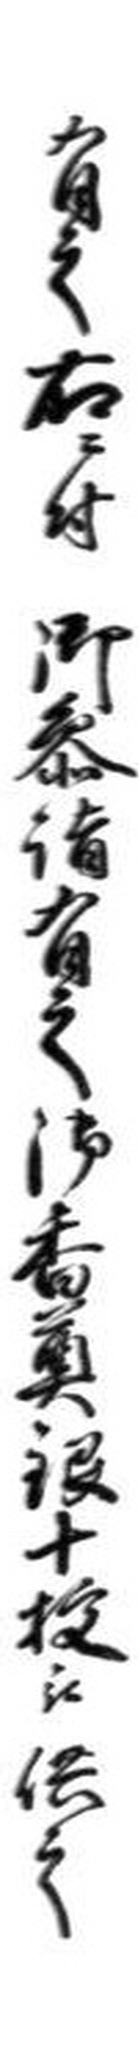有之右ニ付御参詣有之御香奠銀十枚被供之
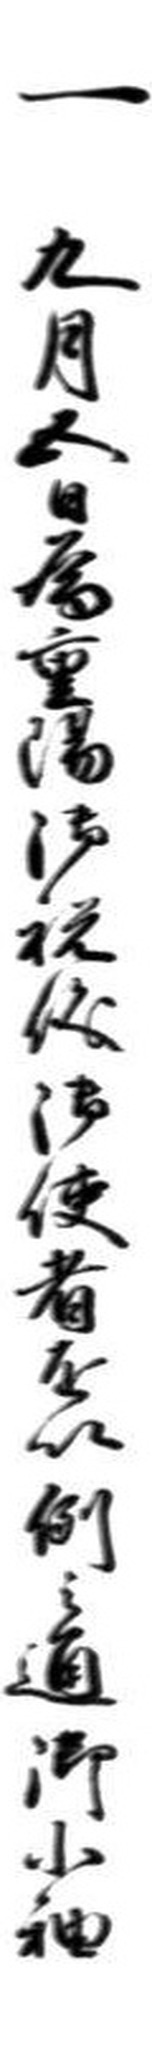一九月五日為重陽御祝儀御使者を以例之通御小袖
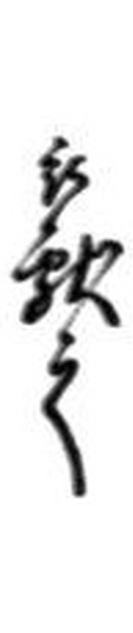被献之
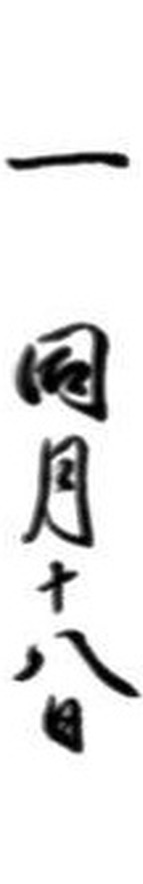一同月十八日
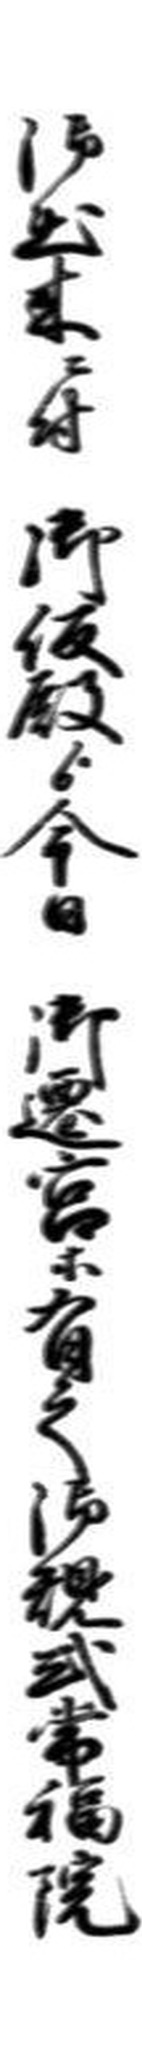御出来ニ付御仮殿ゟ今日御遷宮等有之御規式常福院
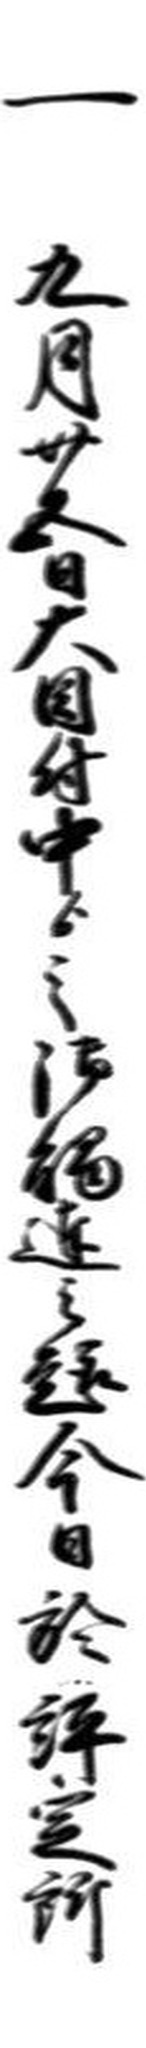一九月廿五日大目付中ゟ之御触達之趣今日於評定所

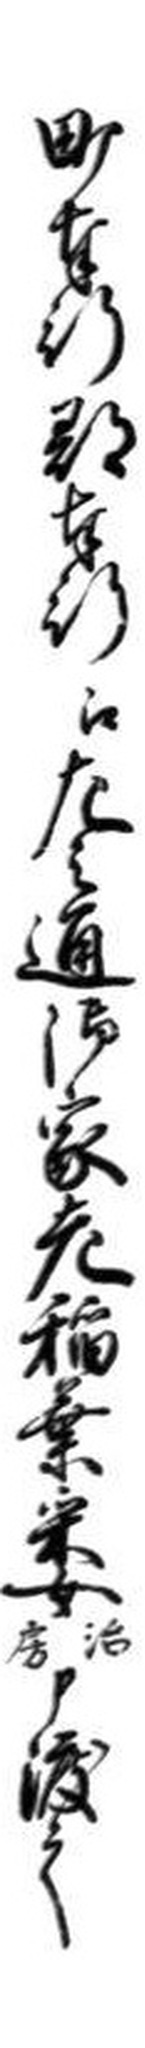町奉行郡奉行江左之通御家老稲葉采女治房申渡之
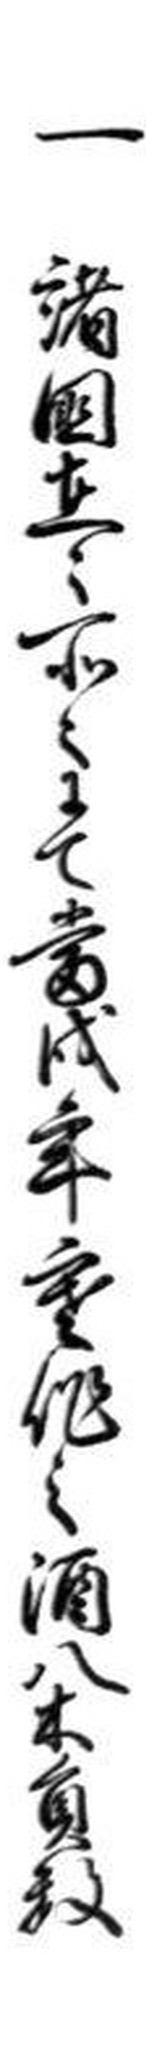一諸国在々所々にて当戌年寒作之酒八木員数
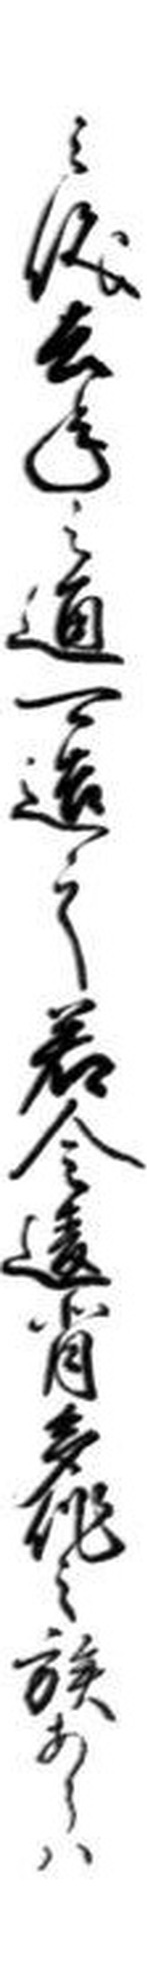之儀去年之通可造之若令違背多作之族あらは
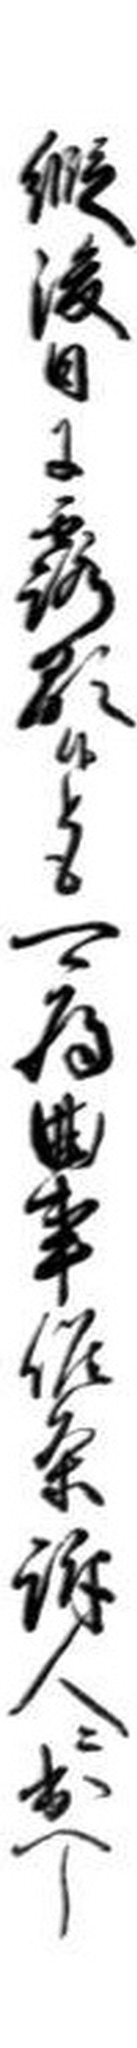縦後日に露顕候とも可為曲事候条訴人ニ出へし
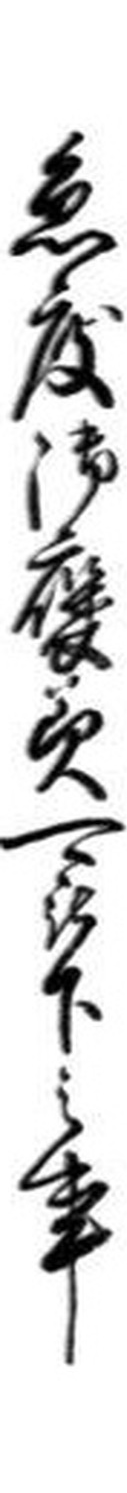急度御褒美可被下之事
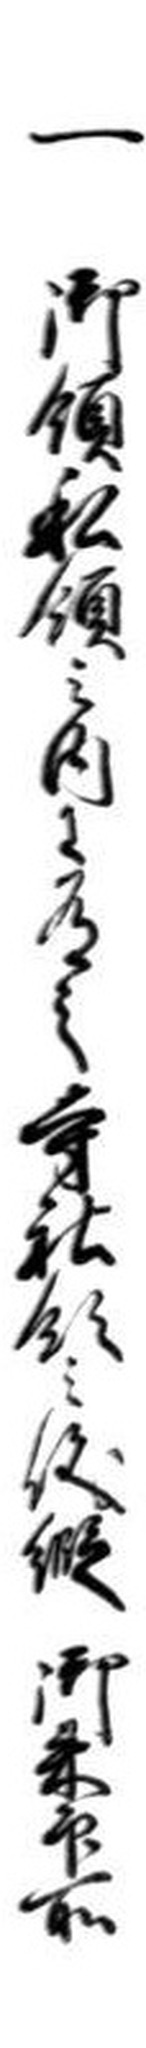一御領私領之内に有之寺社領之儀縦御朱印所
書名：家譜 八 光通公 従寛文十年到同十二年
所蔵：福井県文書館 Fukui Prefectural Archives
